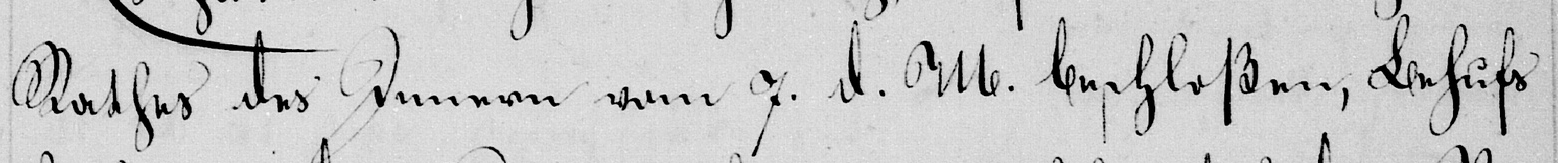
Rathes des Innern vom 7. d. M. beschloßen, Behufs
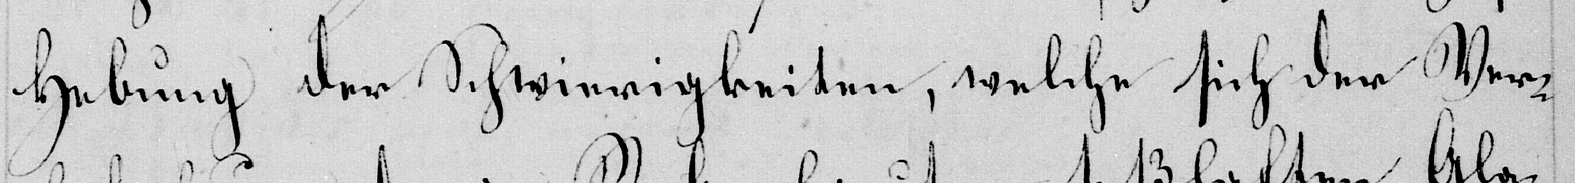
Hebung der Schwierigkeiten, welche sich der Ver¬
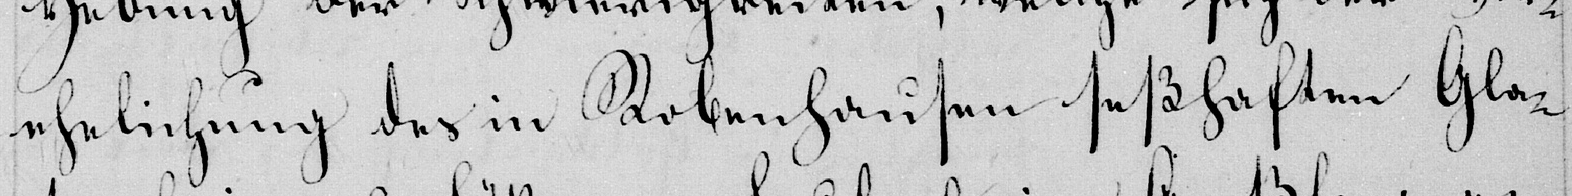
ehelichung des in Robenhausen seßhaften Gla¬
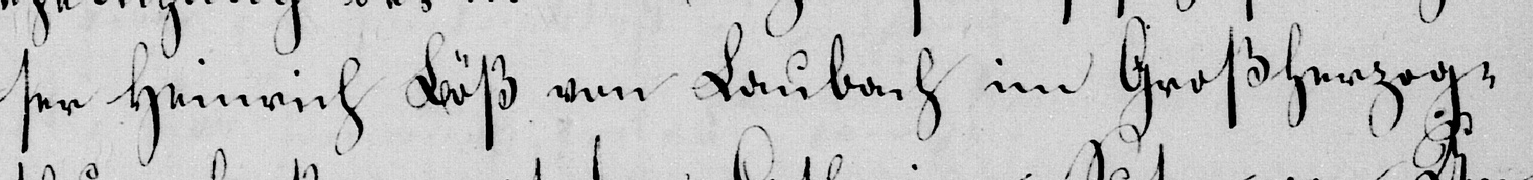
ser Heinrich Böß von Laubach im Großherzog¬
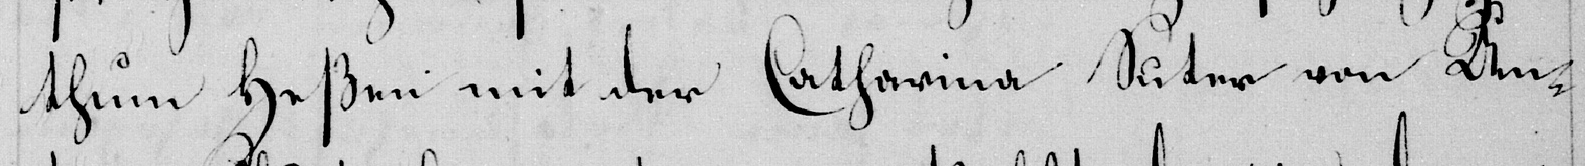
thum Heßen mit der Catharina Suter von Un¬
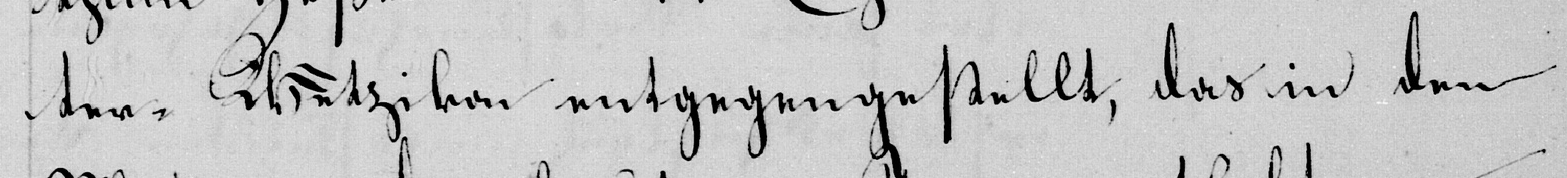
ter-Wetzikon entgegengestellt, das in den
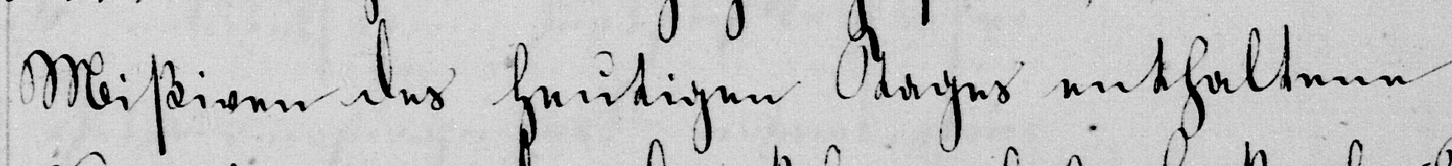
Mißiven des heutigen Tages enthaltene
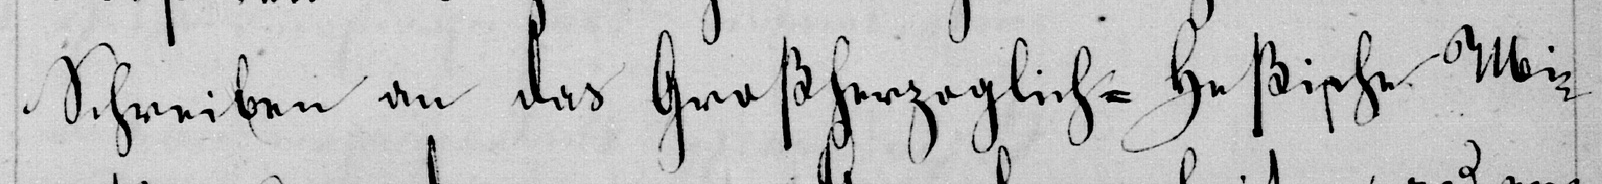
Schreiben an das Großherzoglich-Heßische Mi¬
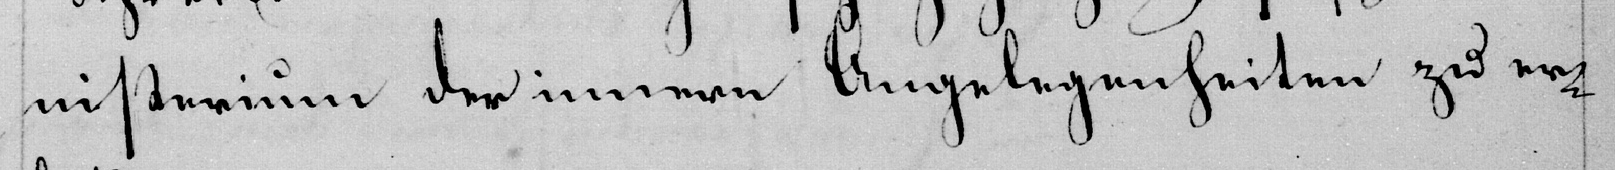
nisterium der innern Angelegenheiten zu er¬
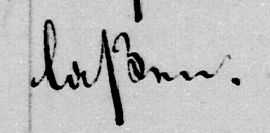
laßen.
